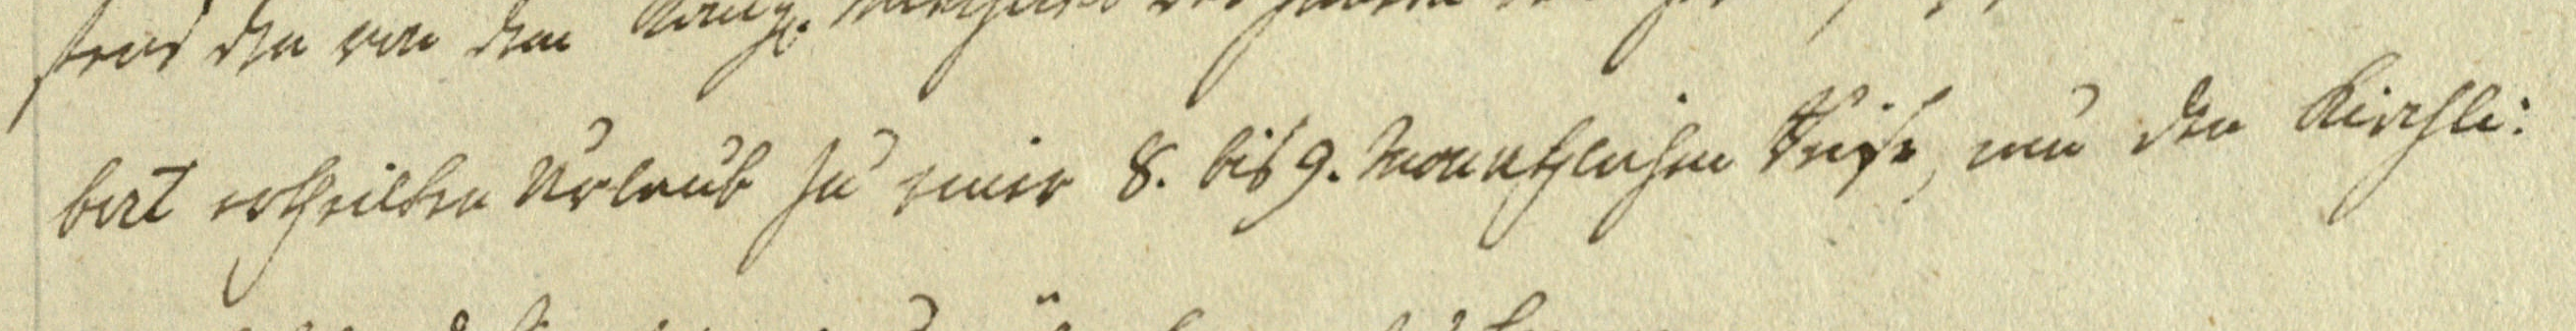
bert ertheilten Urlaub zu einer 8. bis 9. Monathlichen Reise, um den Kirchli¬
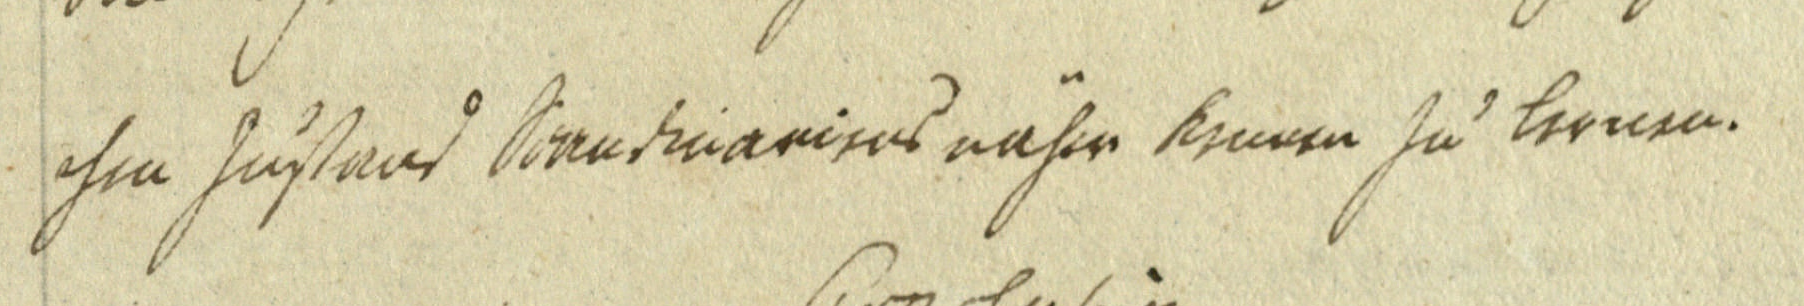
chen Zustand Scandinaviens näher kennen zu lernen.
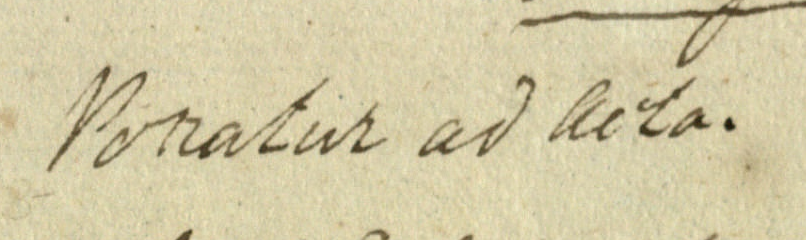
Vonatur ad Acta.
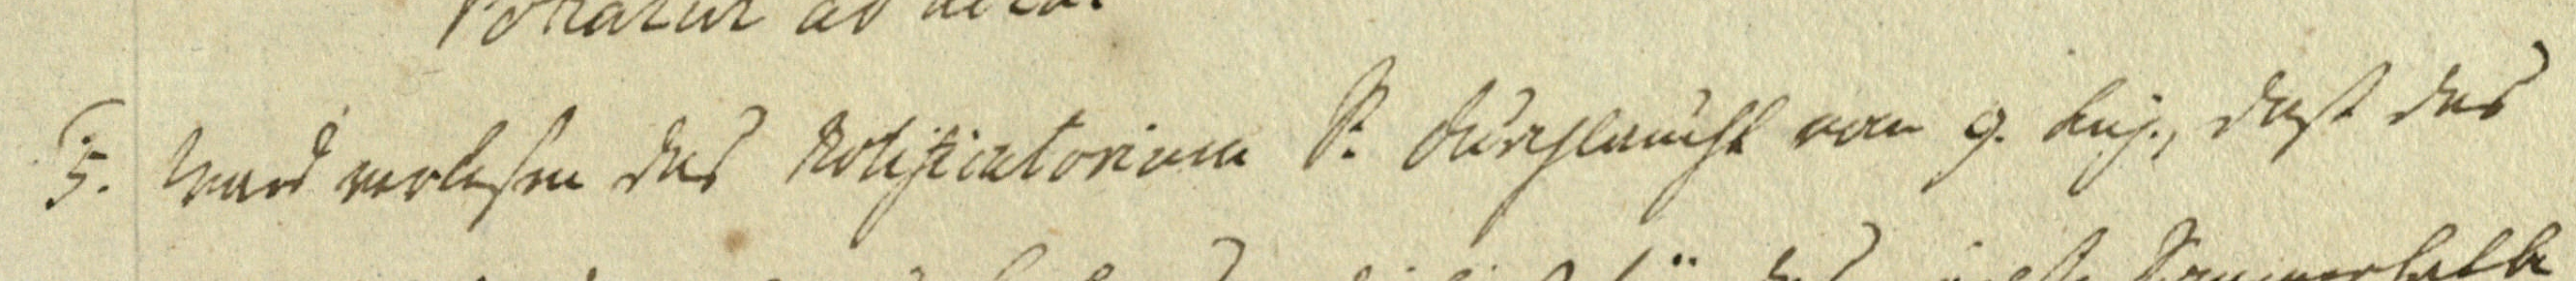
5. Ward verlesen das Notificatorium Sr. Durchlaucht vom 9. huj., daß das
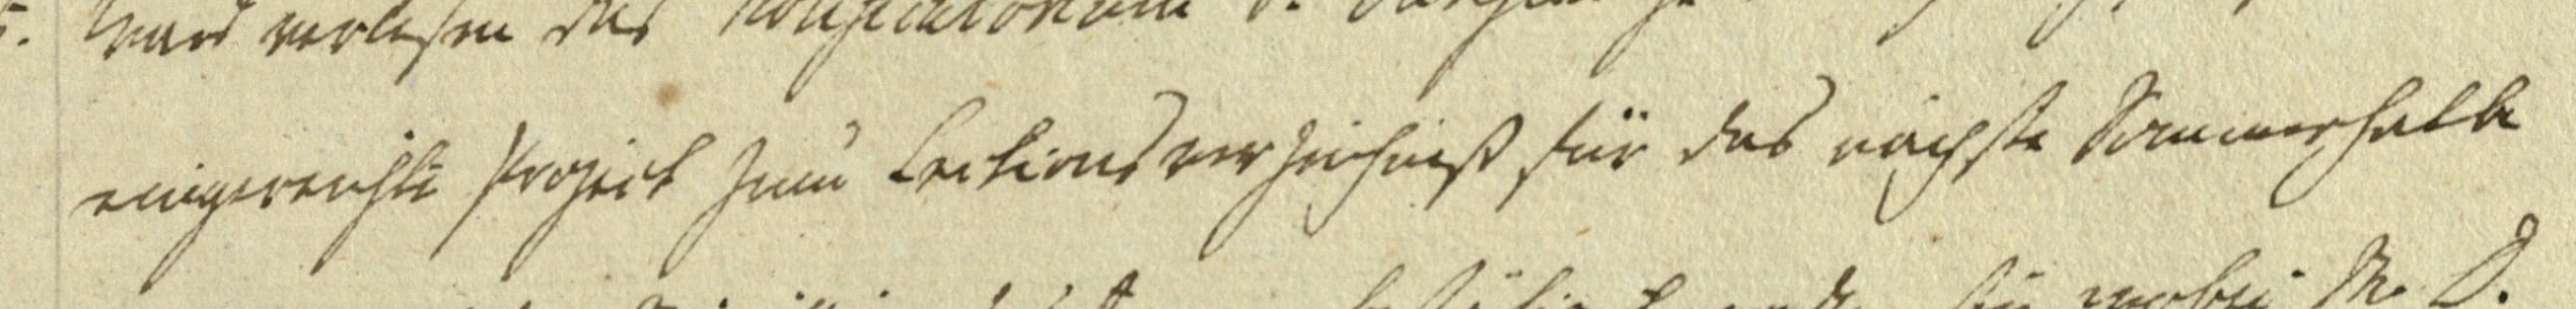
eingereichte Project zum Lectionsverzeichniß für das nächste Sommerhalbe
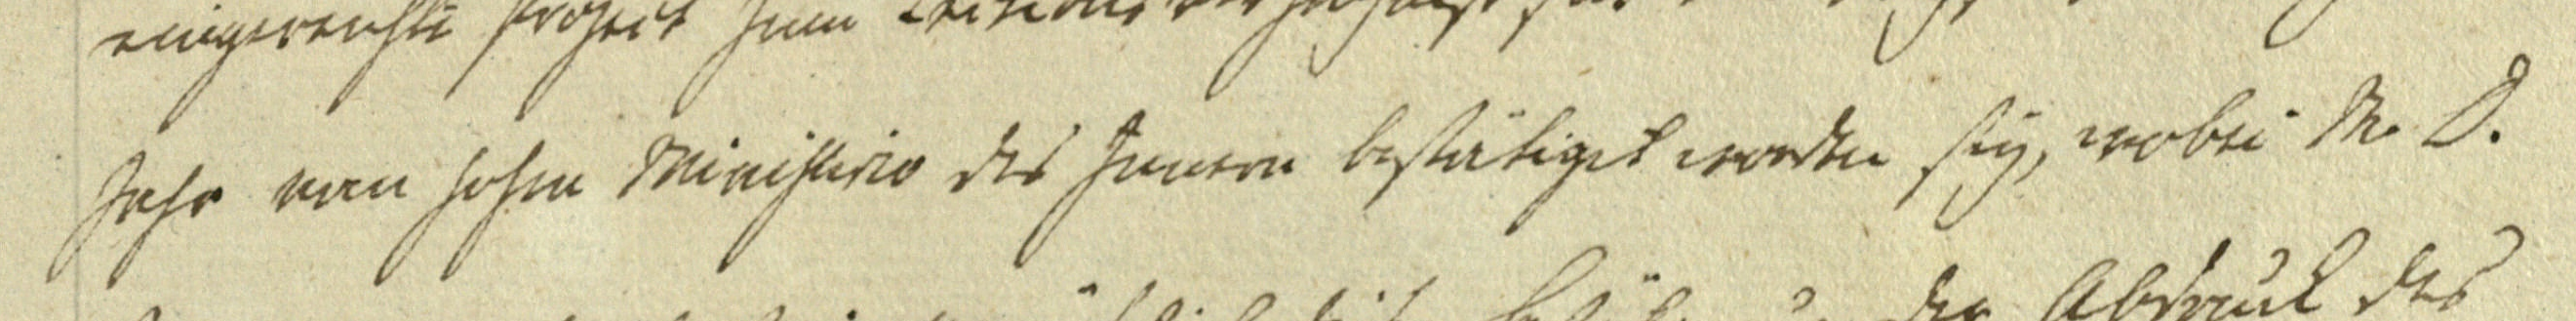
Jahr vom hohen Ministerio des Innern bestätiget worden seÿ, wobei M. D.
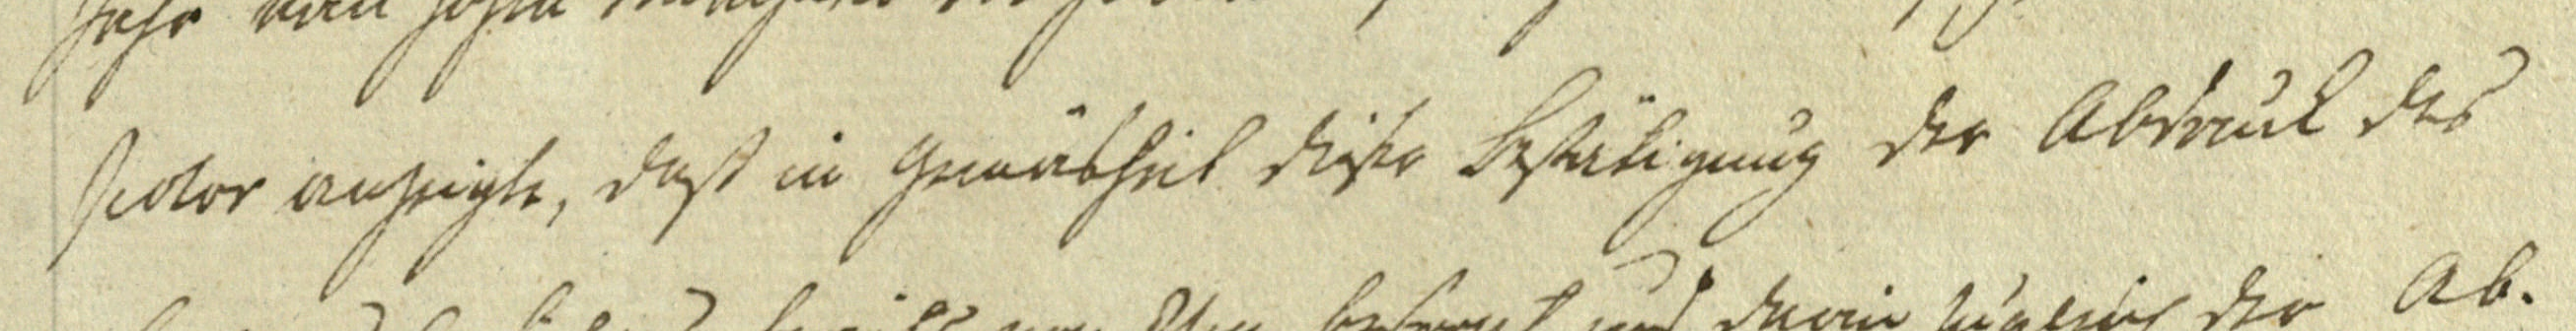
Rector anzeigte, daß in Gemäsheit dieser Bestätigung der Abdruck des
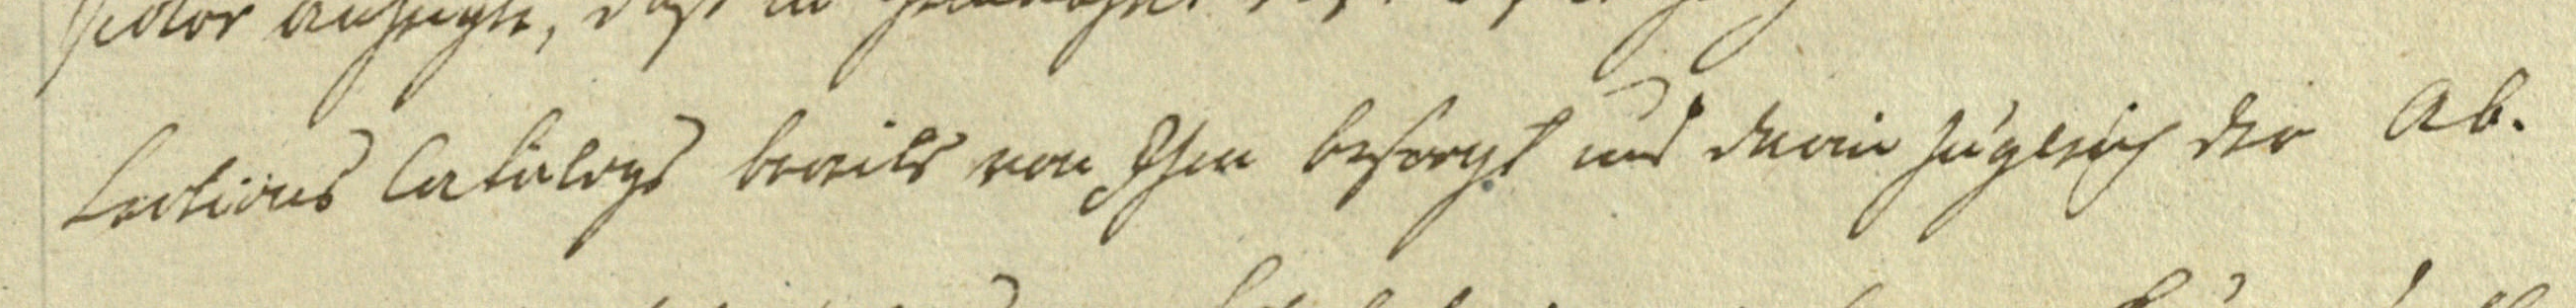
Lections Catalogs bereits von Ihm besorgt und darin zugleich der Ab¬
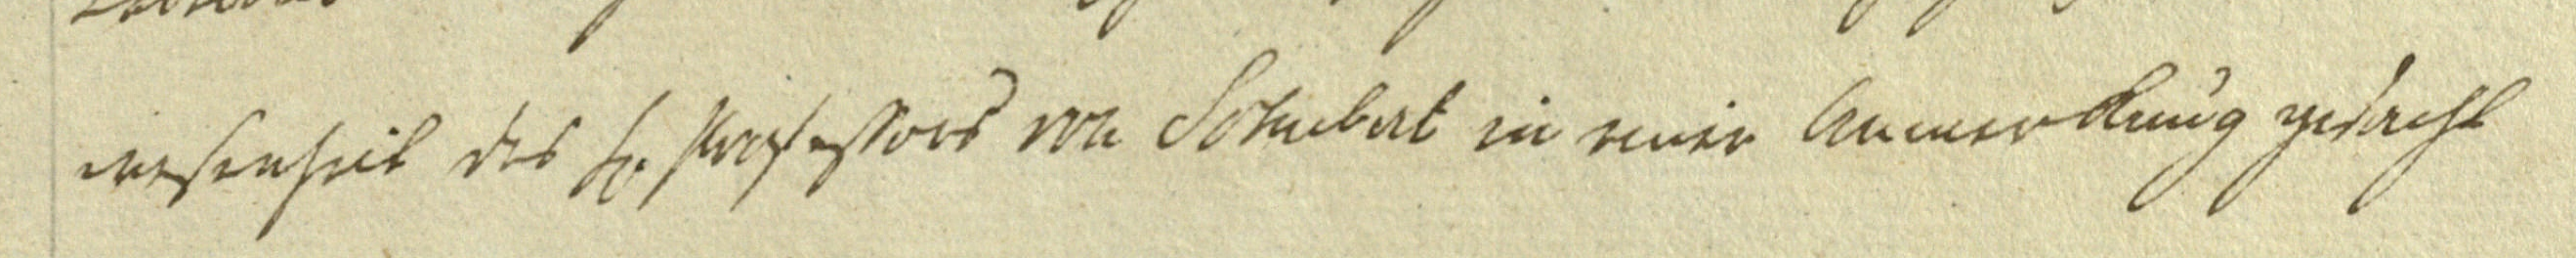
wesenheit des H. Professors von Schubert in einer Anmerkung gedacht
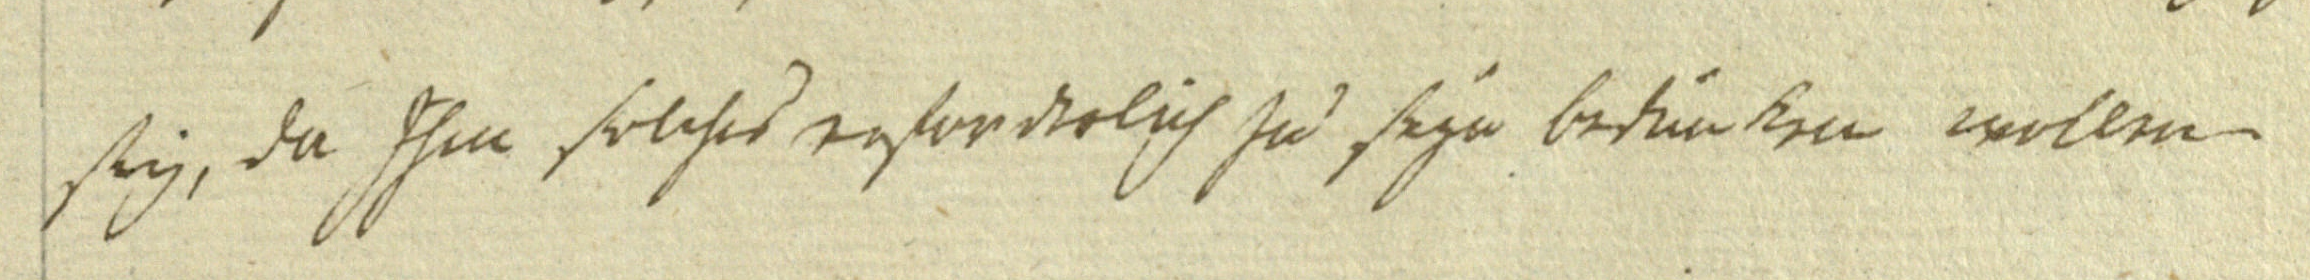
seÿ, da Ihm solches erforderlich zu seÿn bedünken wollen.
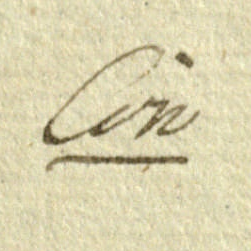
Con
